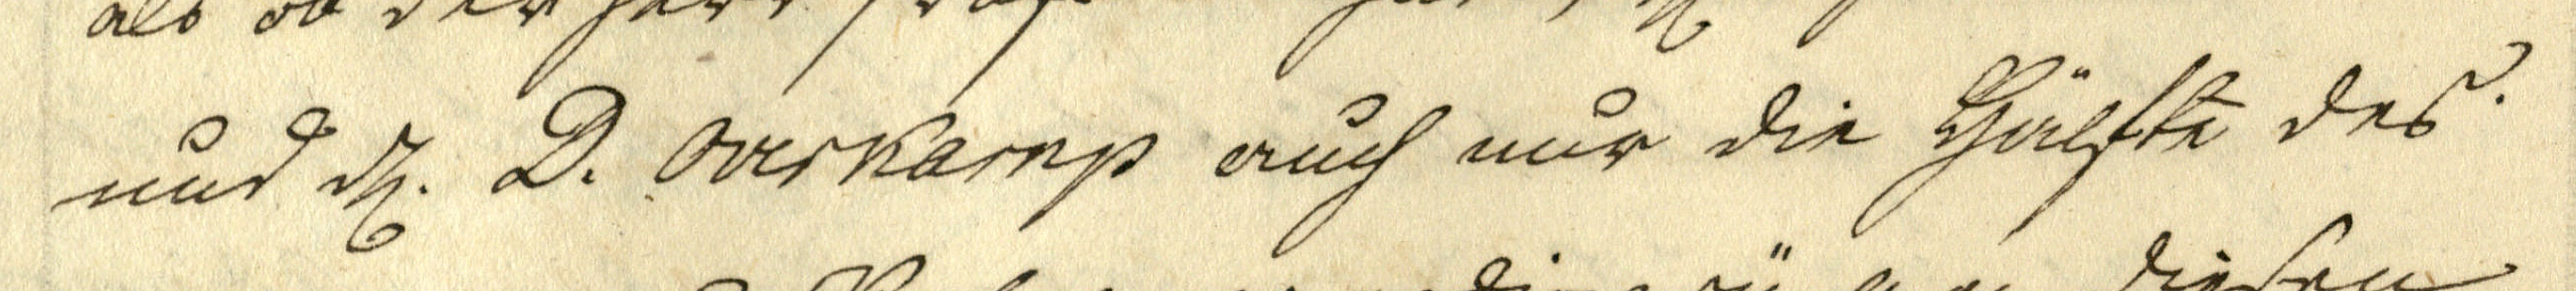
und dh. D. Overkamp auch nur die Hälfte des
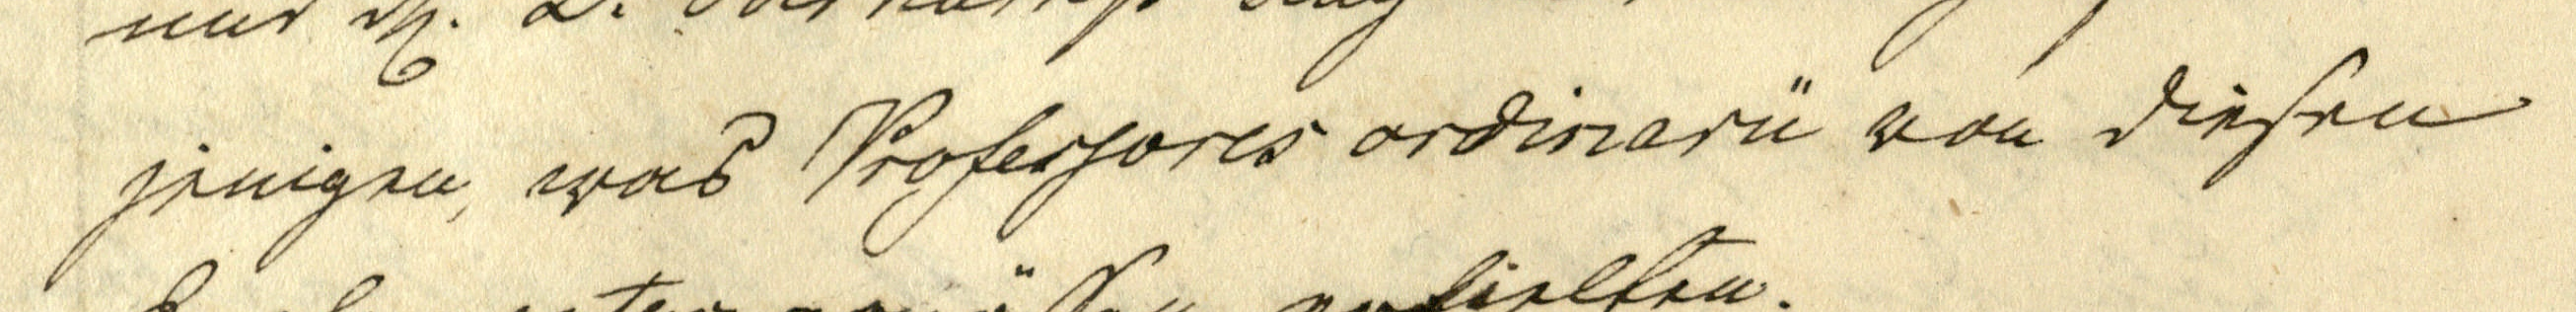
jenigen, was Professores ordinarii von diesen
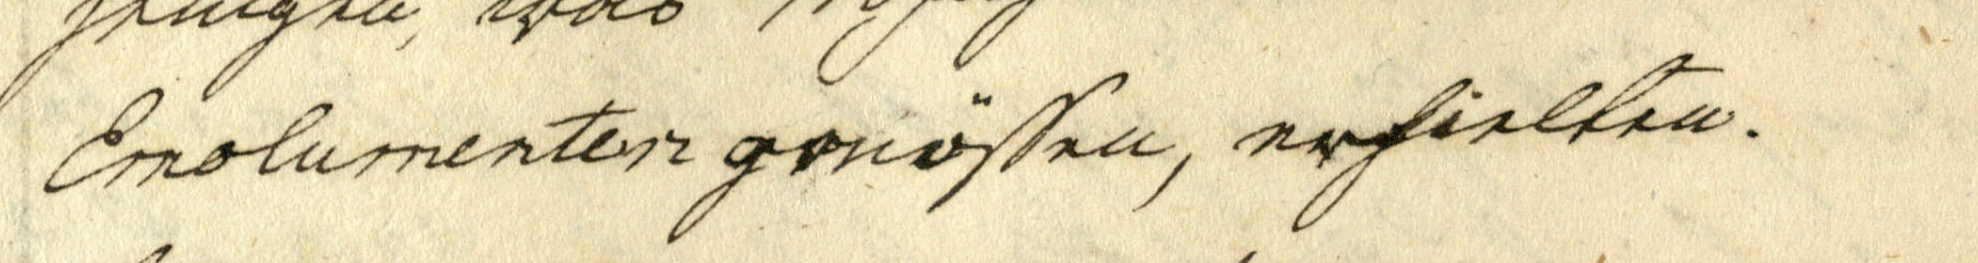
Emolumenten genössen, erhielten.
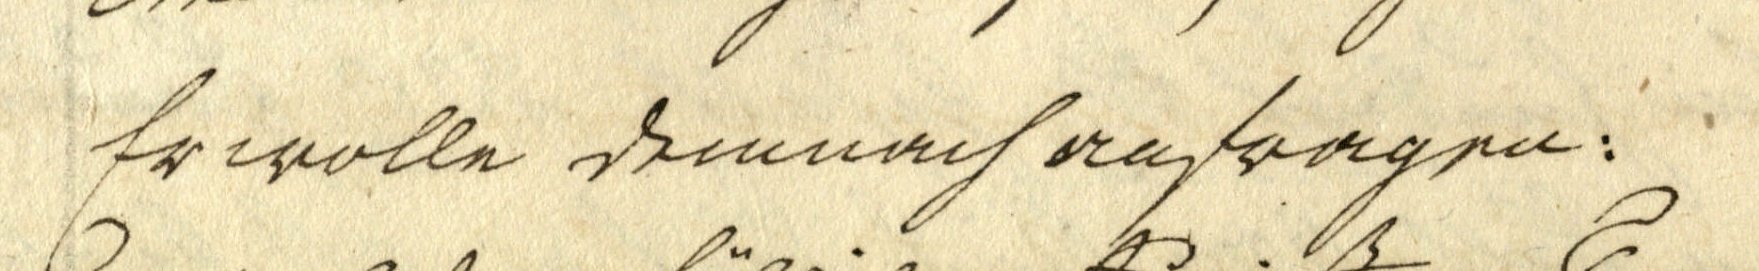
Er wolle demnach anfragen:
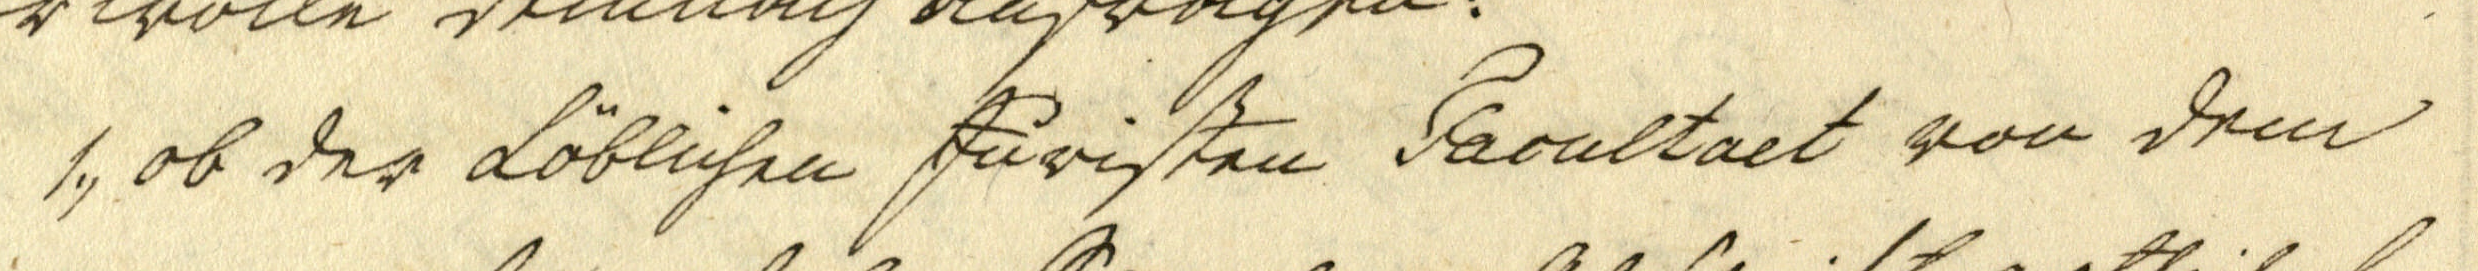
1., ob der Löblichen Juristen Facultaet von dem
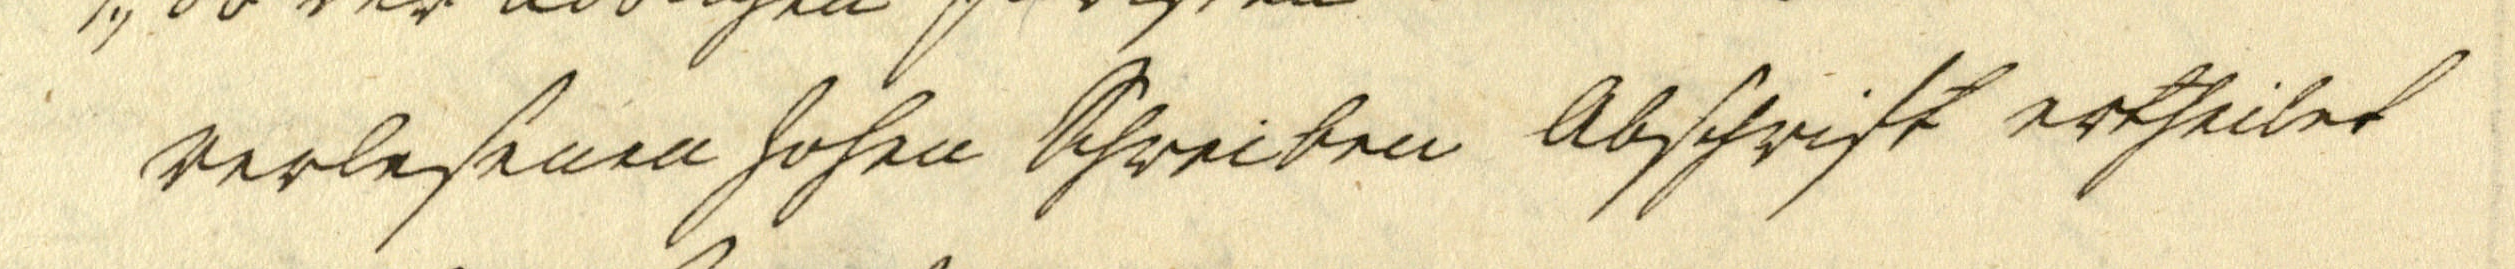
verlesenen hohen Schreiben Abschrift ertheilet
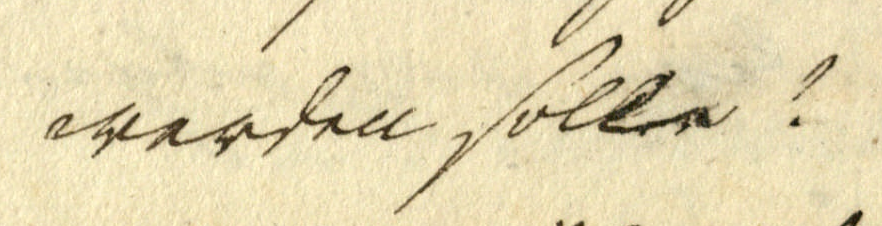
werden solle?
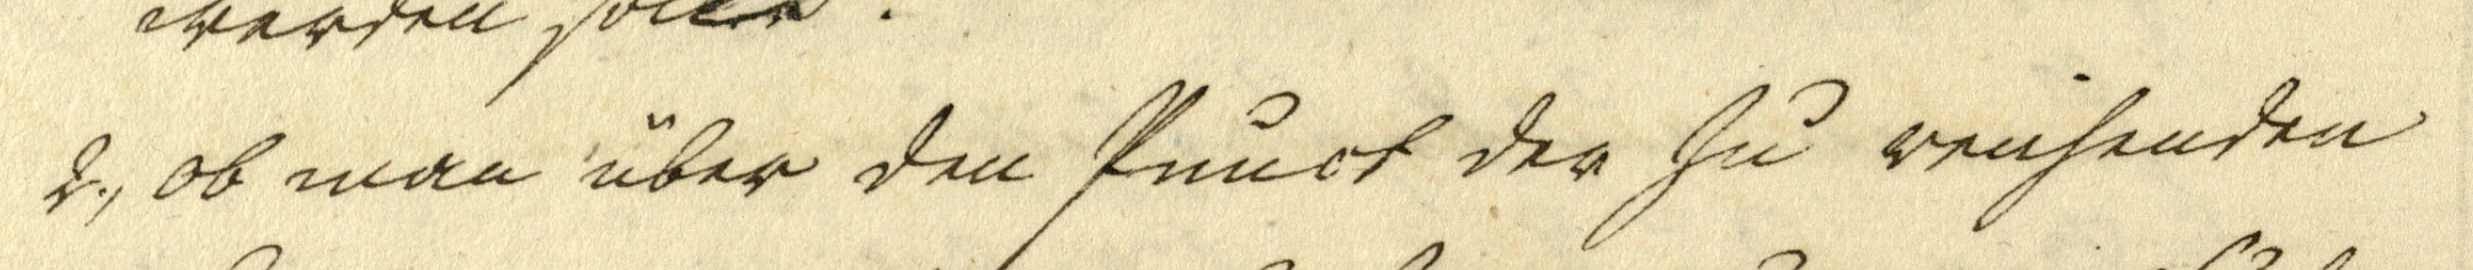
2., ob man über den Punct der zu reichenden
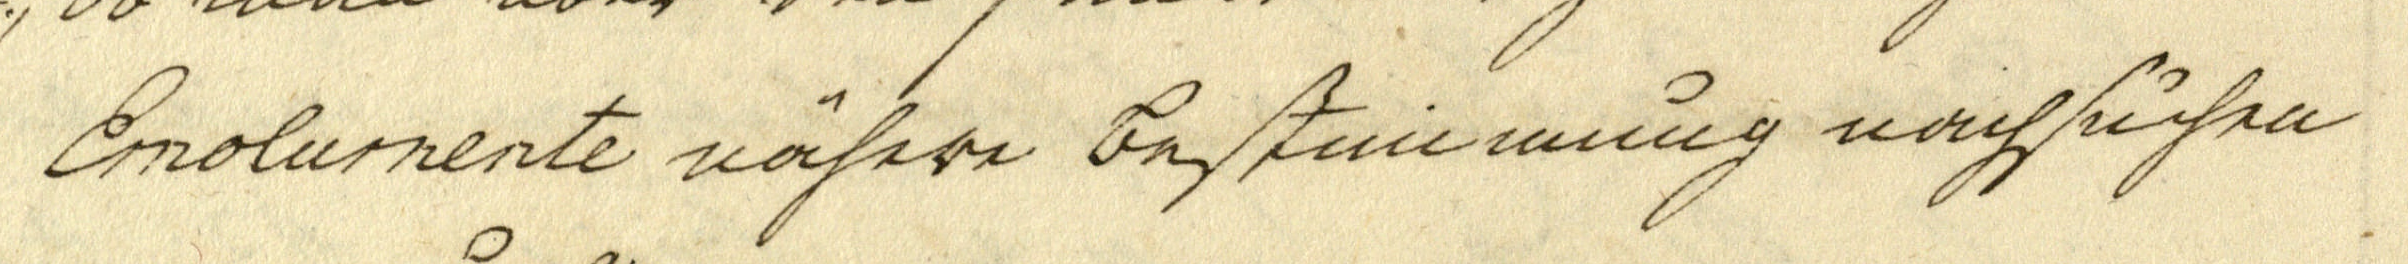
Emolumente nähere Bestimmung nachsuchen
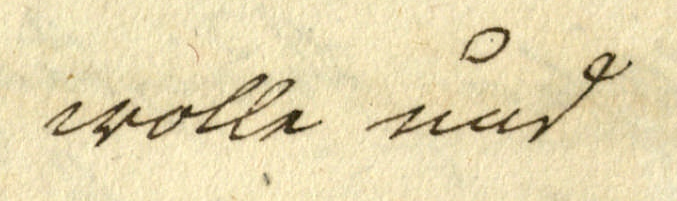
wolle und
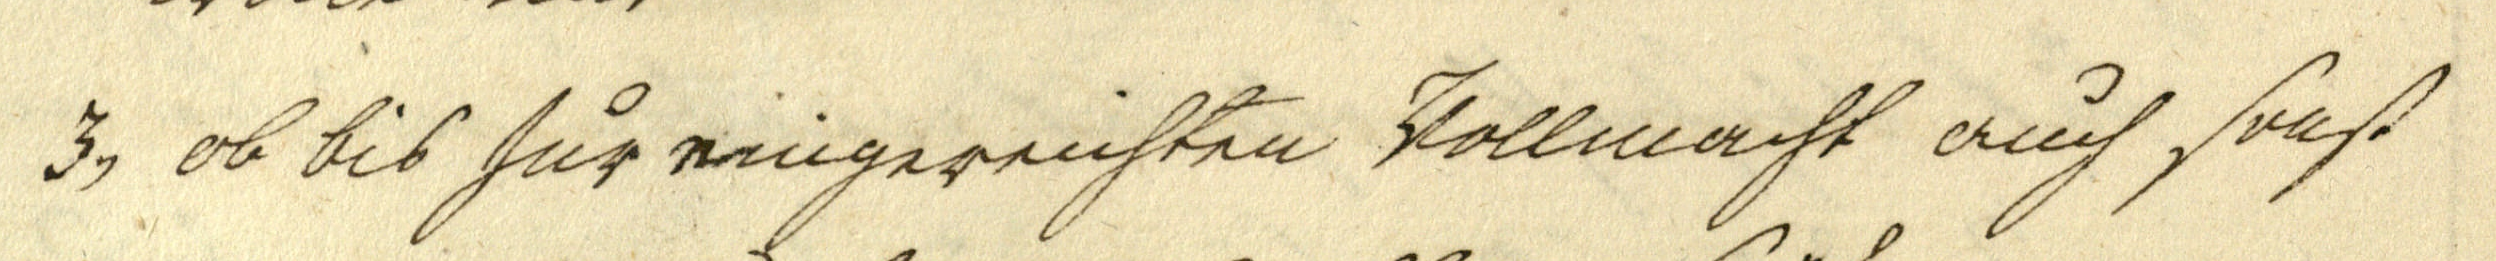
3., ob bis zur eingereichten Vollmacht auch sonst
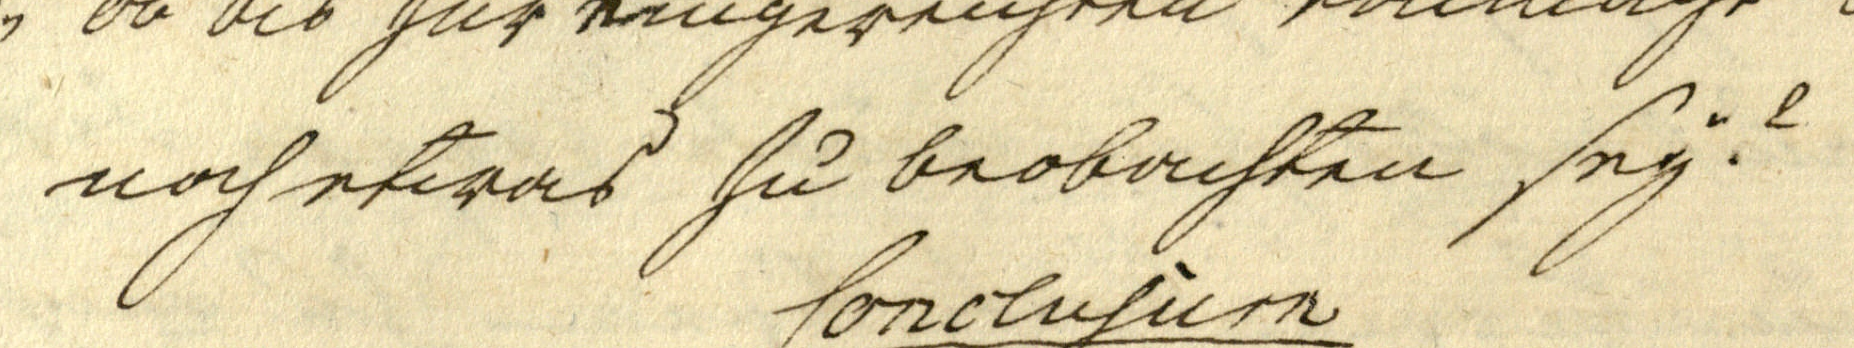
noch etwas zu beobachten seÿ?
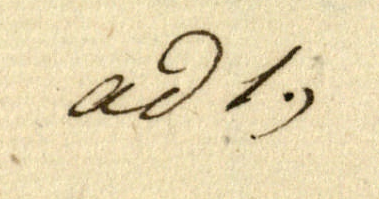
ad 1.,
